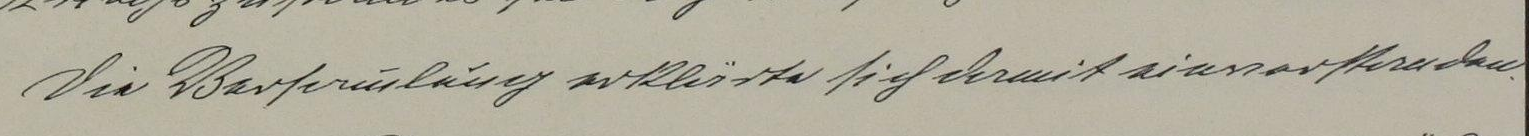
Die Versammlung erklärte sich damit einverstanden.
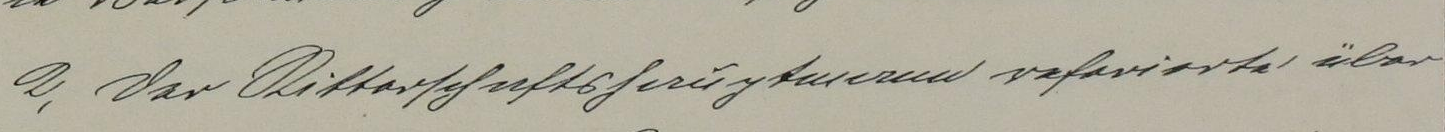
2. Der Ritterschaftshauptmann referierte über
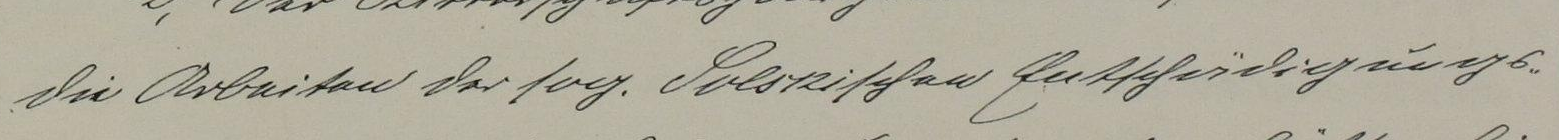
die Arbeiten der sog. Solskischen Entschädigungs-
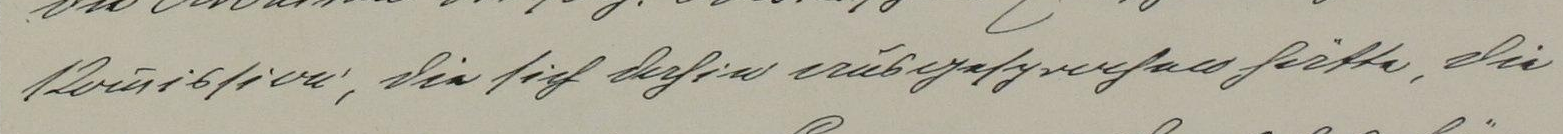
kommission, die sich dahin ausgesprochen hätte, die
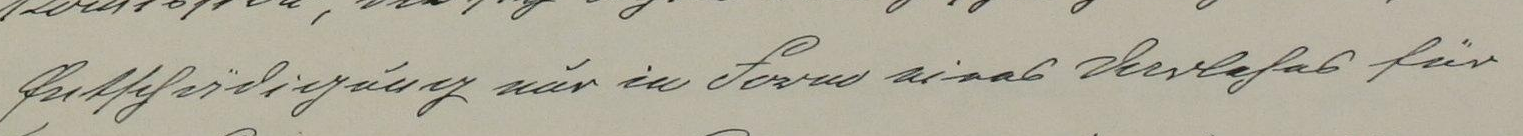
Entschädigung nur in Form eines Darlehns für
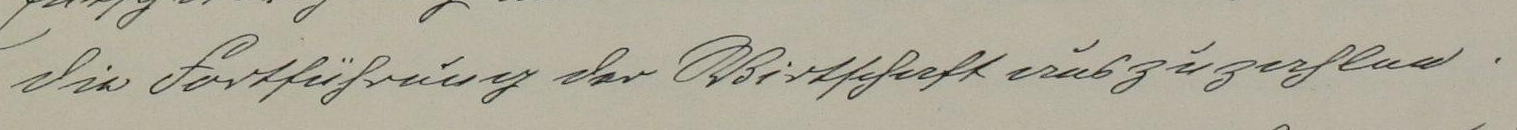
die Fortführung der Wirtschaft auszuzahlen.
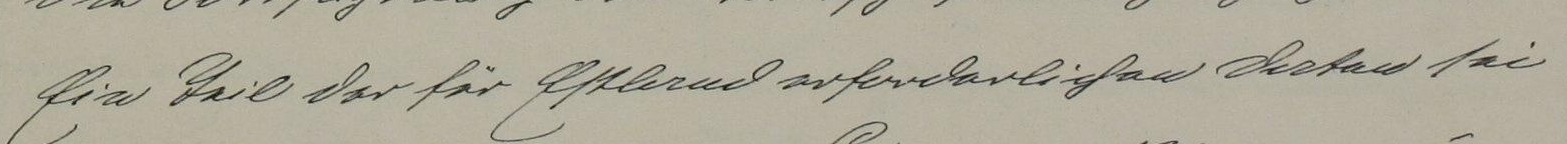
Ein Teil der für Estland erforderlichen Daten sei
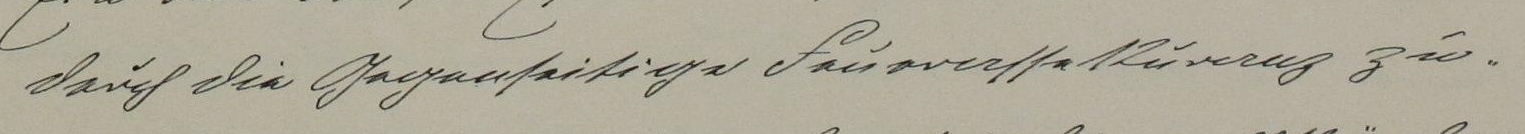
durch die Gegenseitige Feuerassekuranz zu-
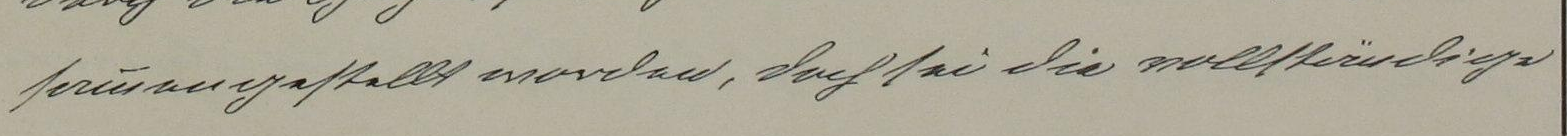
sammengestellt worden, doch sei die vollständige
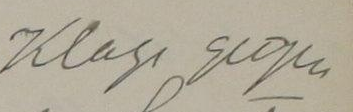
Klage gegen
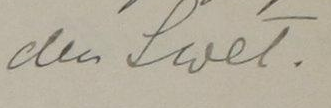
den Swet.
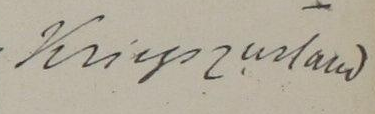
Kriegszustand
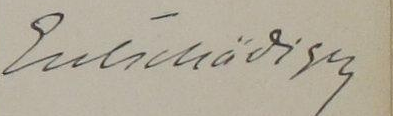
Entschädigung
